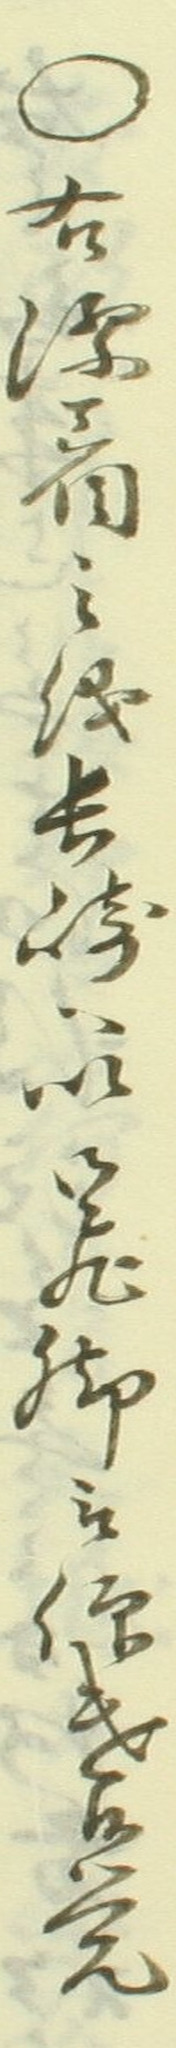〇右漂着之儀長崎へ以御飛脚被仰遣候覚
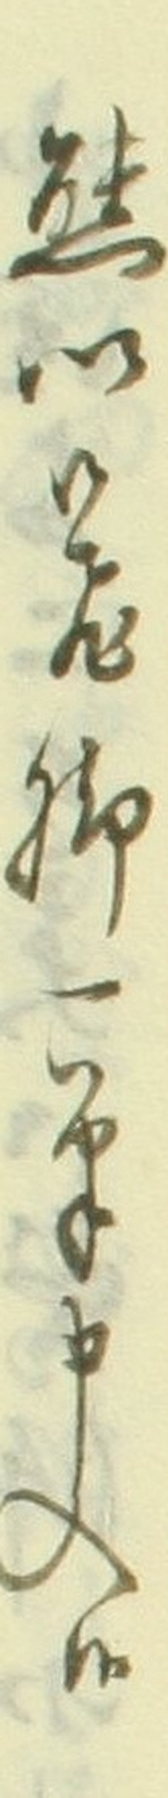態以御飛脚一筆申入候
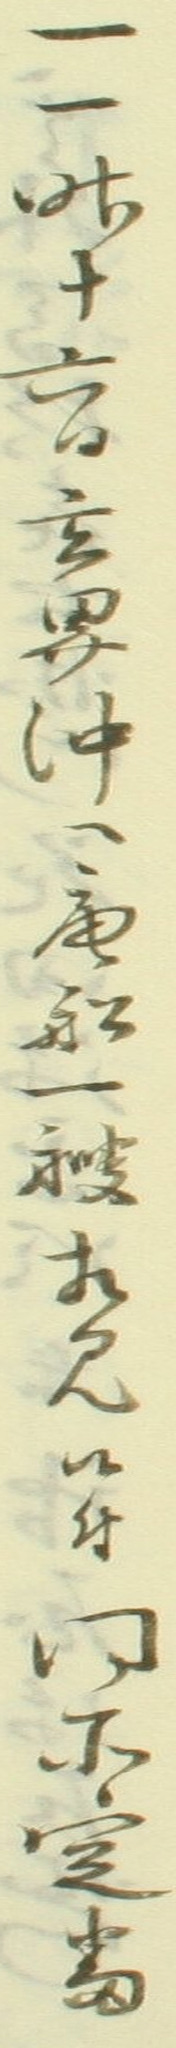一一昨十六日玄界沖へ唐船一艘相見候付同所定番
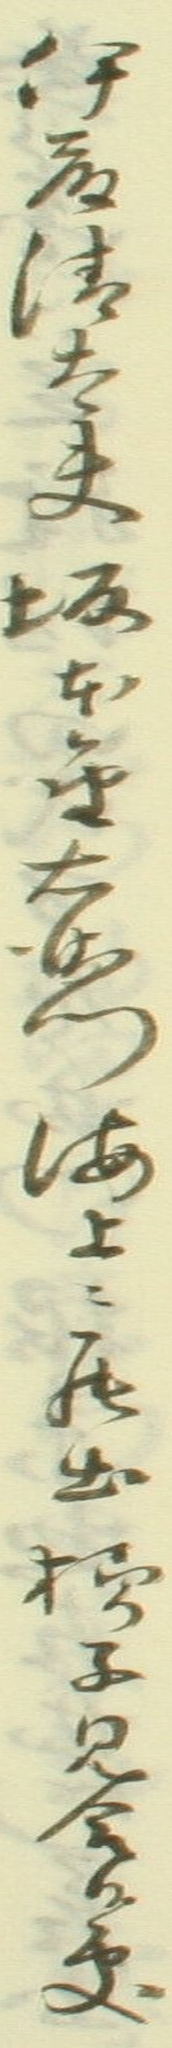伊藤清太夫坂本金右衛門海上に罷出様子見合候処
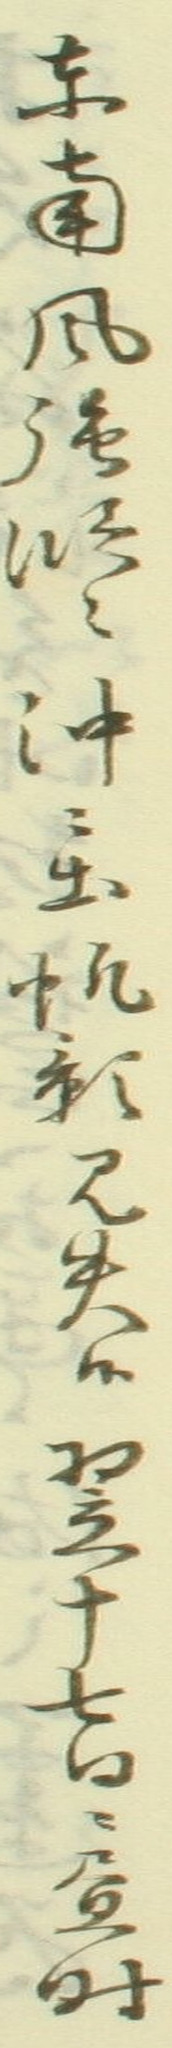東南風強段々沖に出帆影見失候翌十七日に昼時
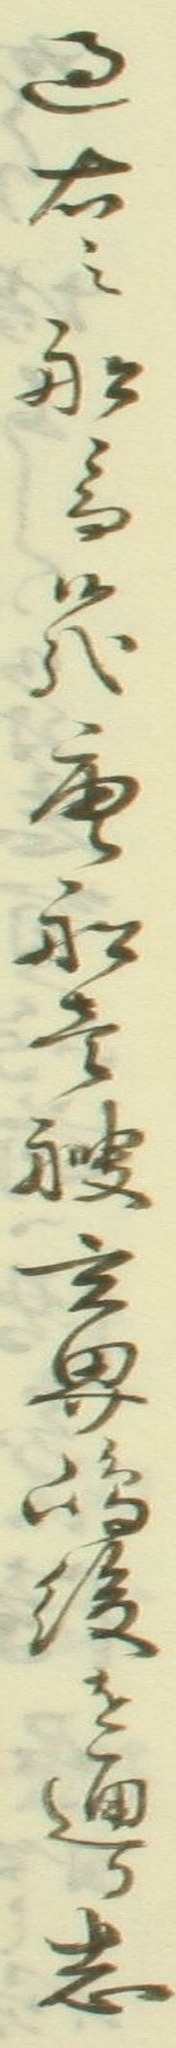過右之船に而候矢哉唐船壱艘玄界嶋後を通り志
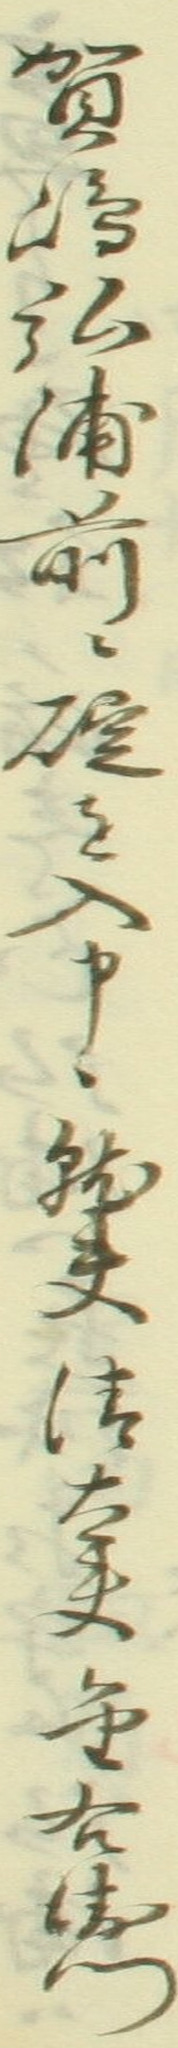賀嶋弘浦前に碇を入申候就夫清太夫金右衛門

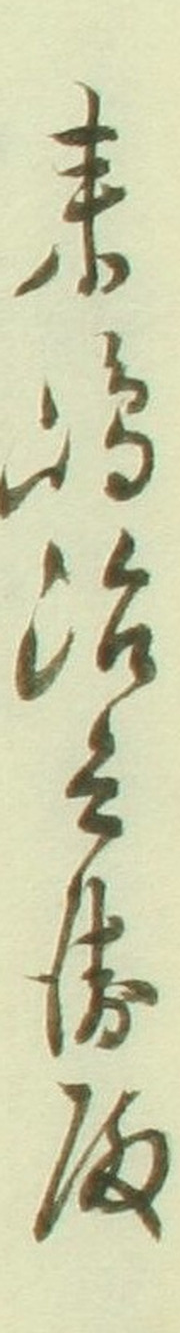来嶋治兵衛殿
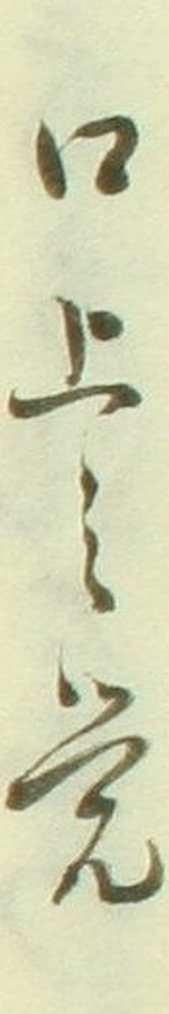口上之覚
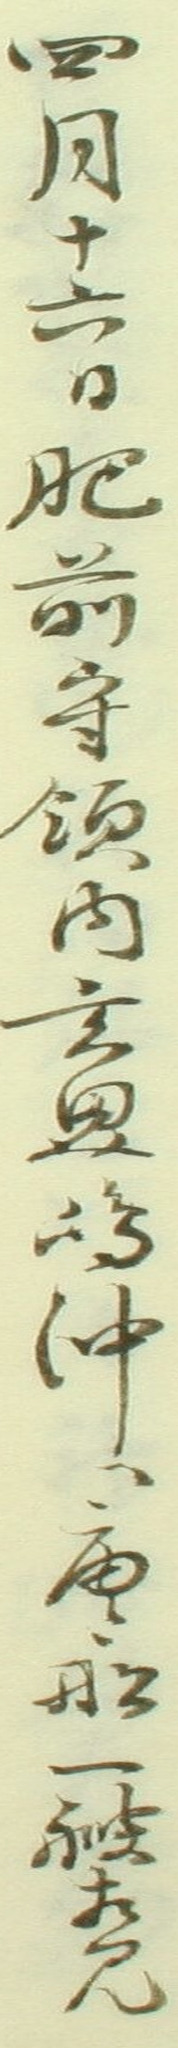四月十六日肥前守領内玄界嶋沖へ唐船一艘相見
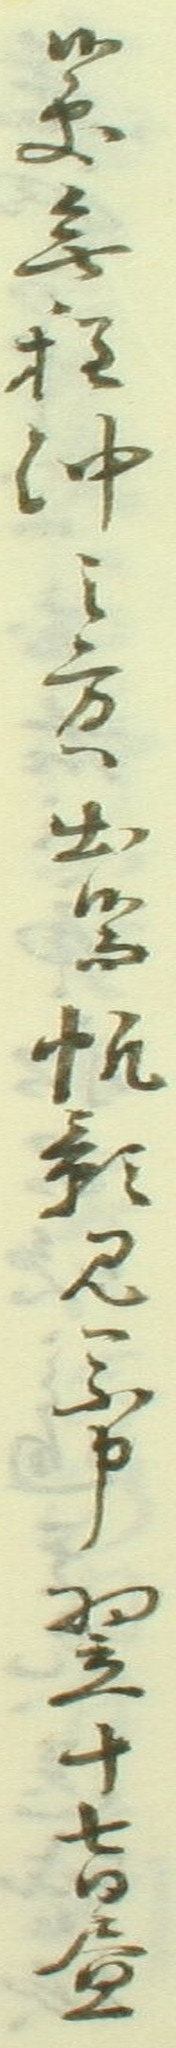候処無程沖之方へ出候而帆影見へ不申翌十七日昼
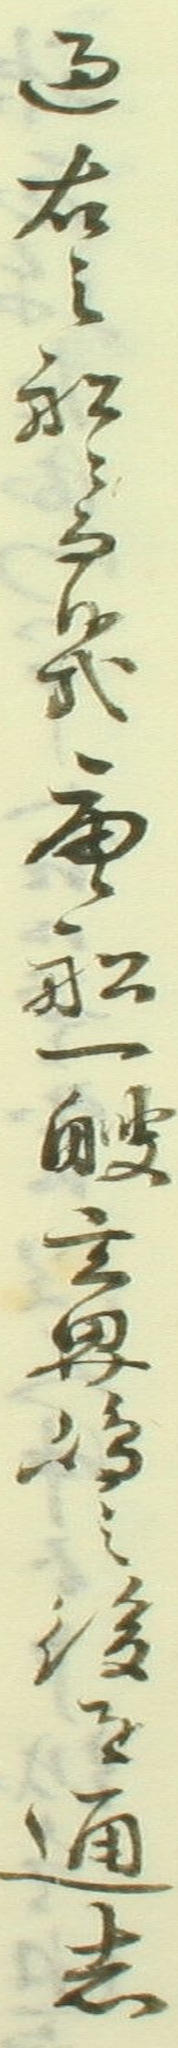過右之船に而候哉唐船一艘玄界嶋之後を通志
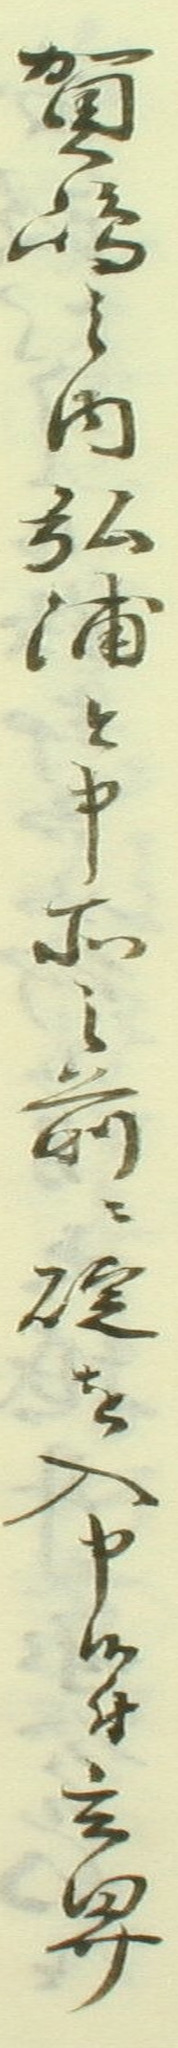賀嶋之内弘浦と申所之前に碇を入申候付玄界
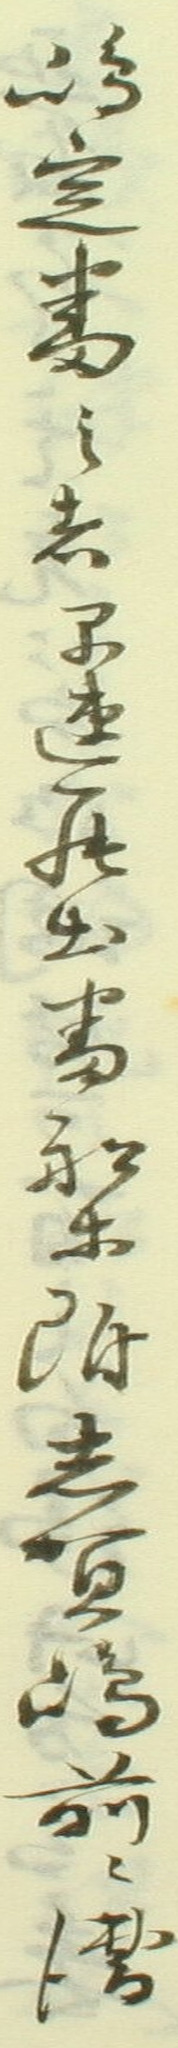嶋常番之者早速罷出番船等附志賀嶋前に漂
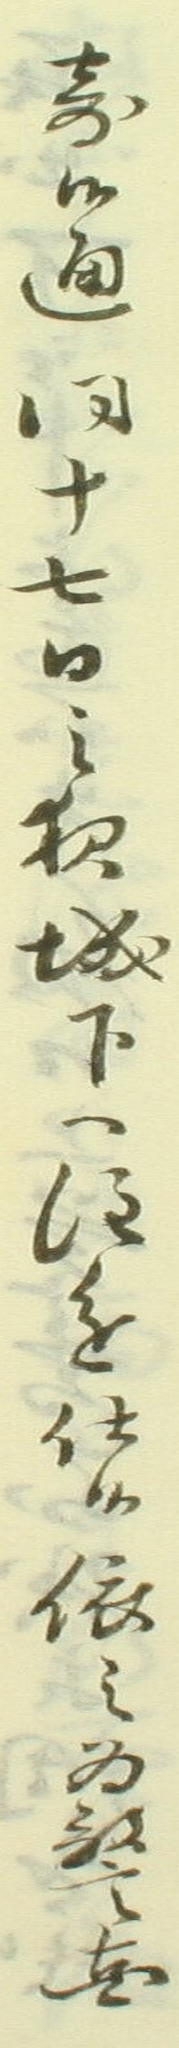寄候通同十七日之夜城下へ注進仕候依之為警固
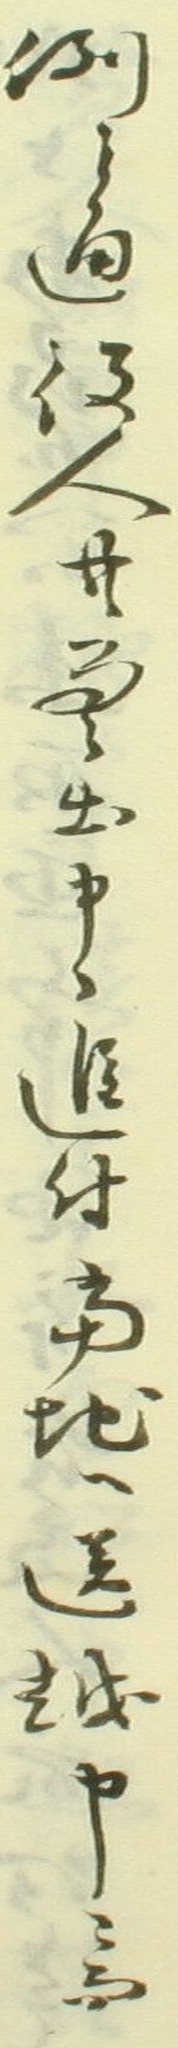例之通役人共差出申候追付当地へ送越申に而
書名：異国船漂着記
